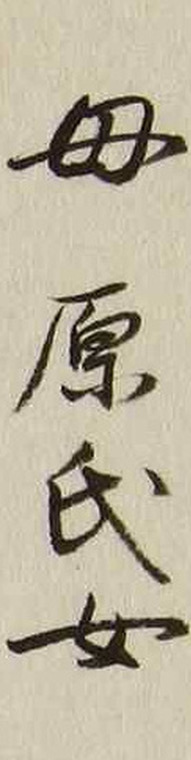母原氏女
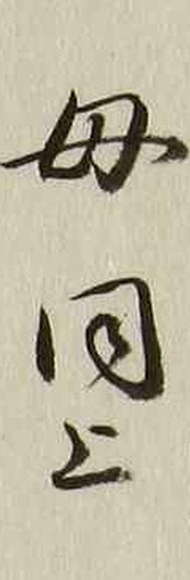母同上
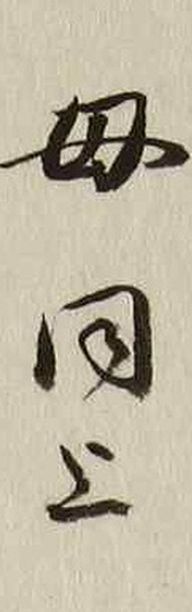母同上
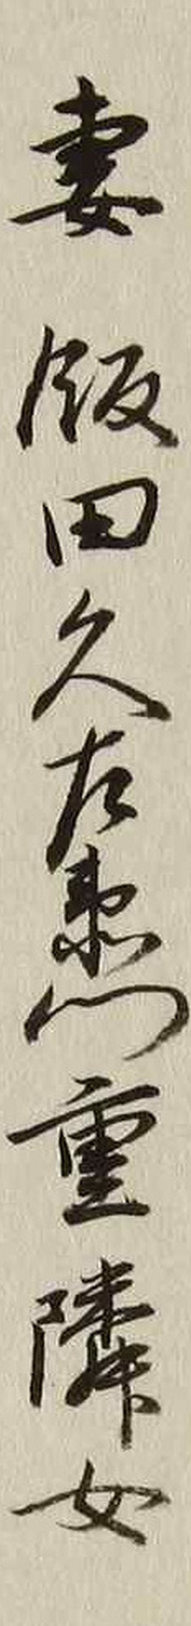妻飯田久左衛門重隣女
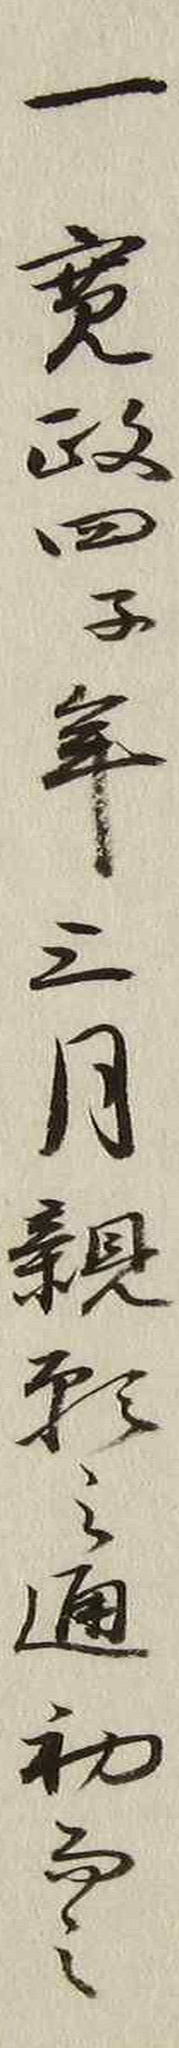一寛政四子年三月親願之通初而之
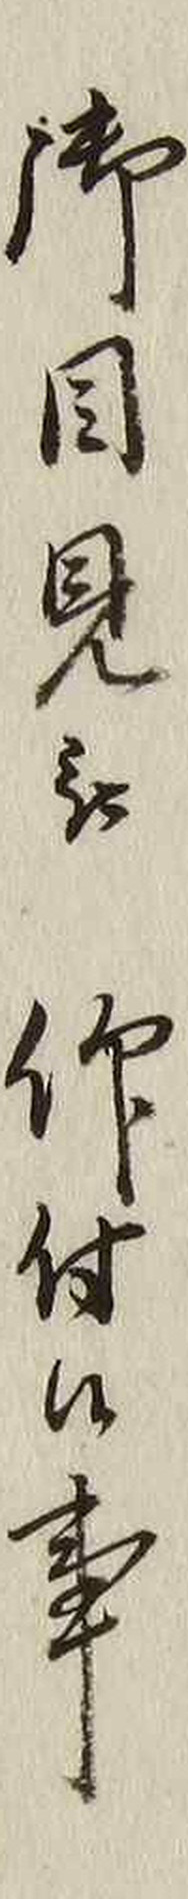御目見被仰付候事
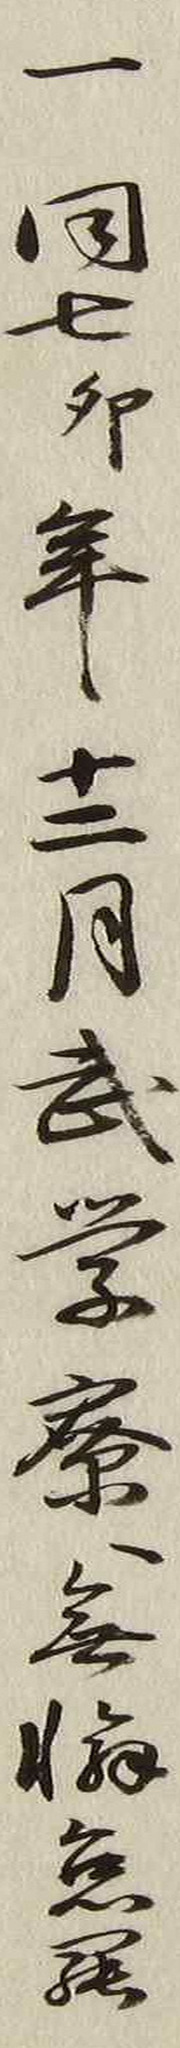一同七卯年十二月武学寮へ無懈怠罷
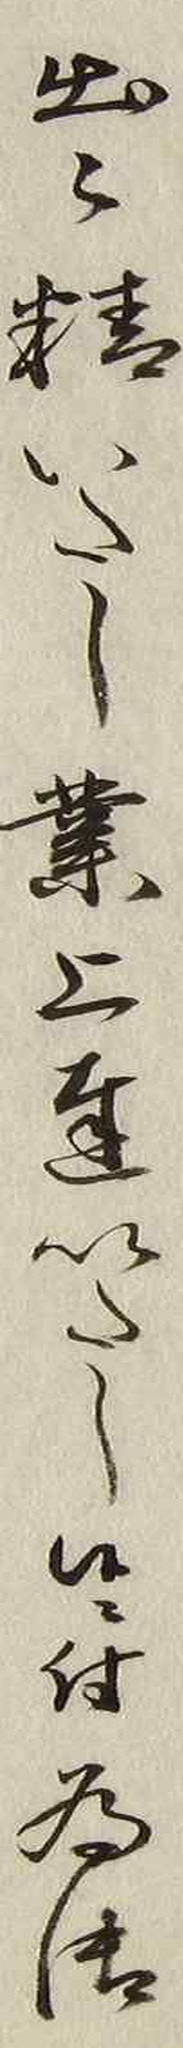出々精いたし業上達いたし候ニ付為御
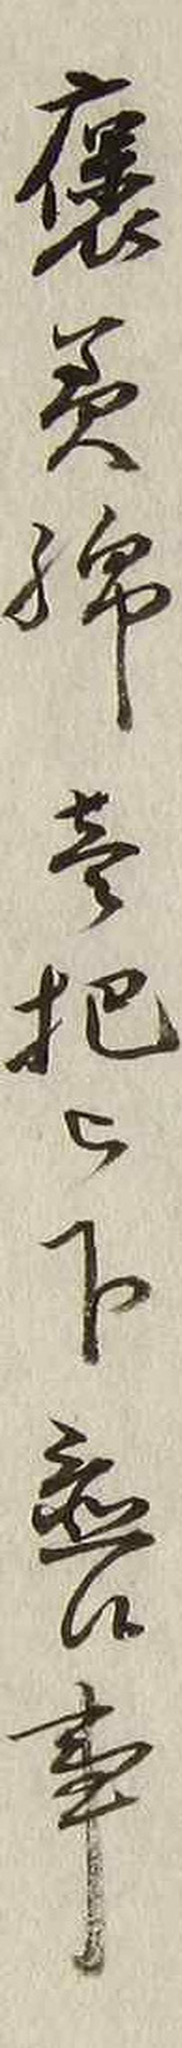褒美綿壱把被下置候事
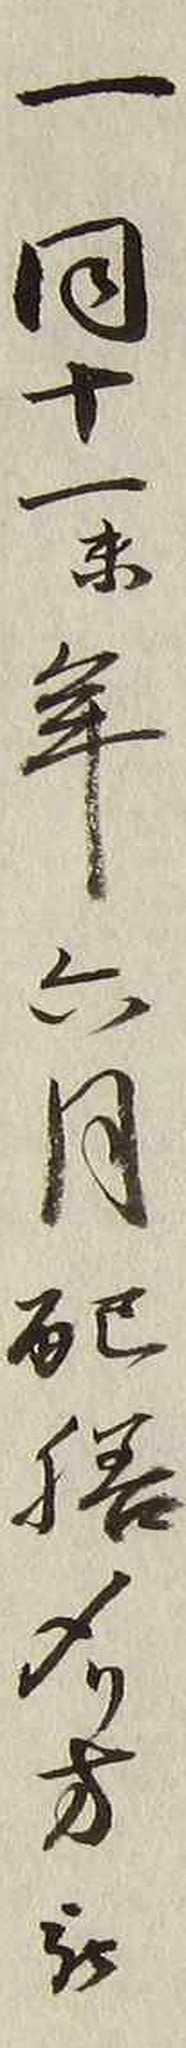一同十一未年六月配膳〆ㇼ方被
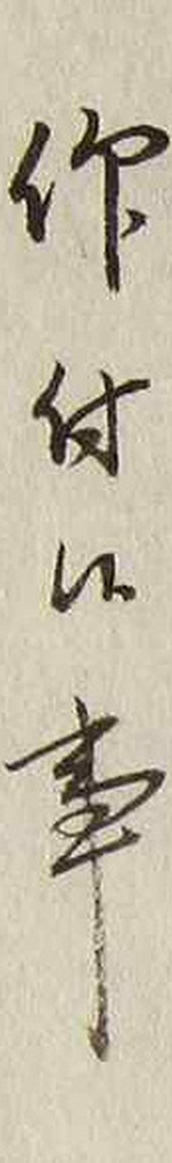仰付候事
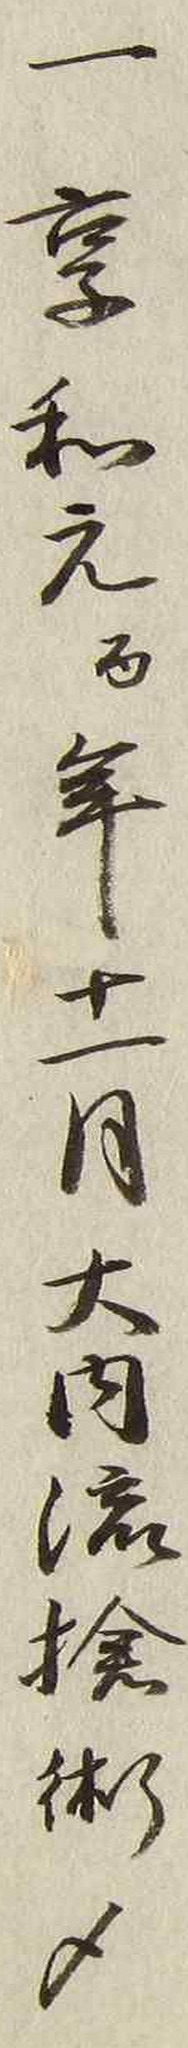一享和元酉年十一月大内流槍術〆

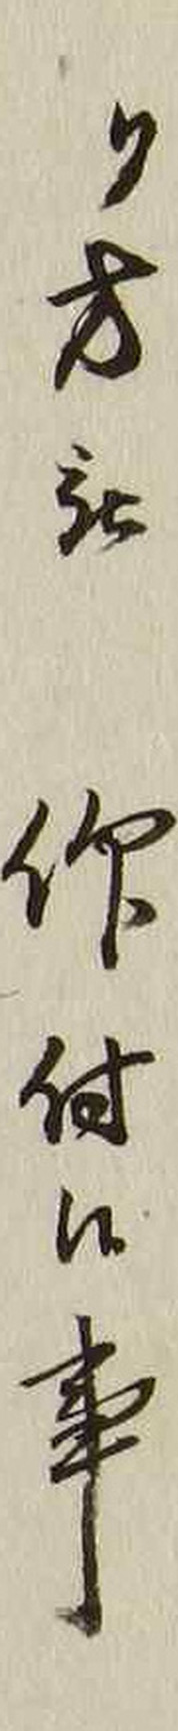ㇼ方被仰付候事
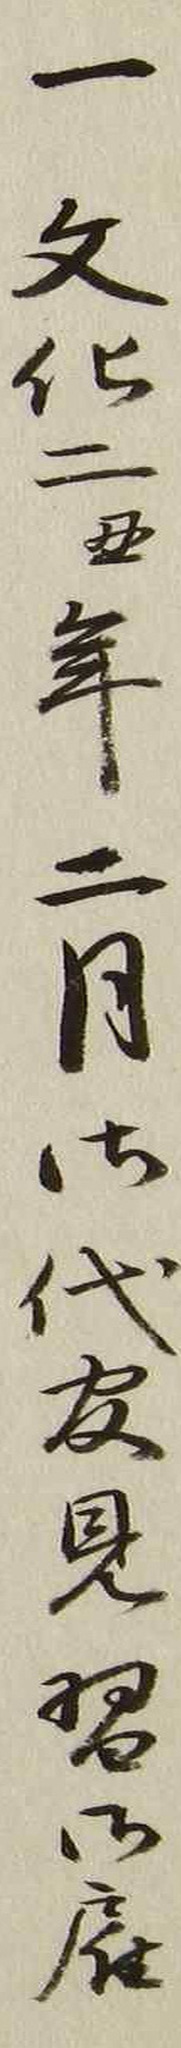一文化二丑年二月御代官見習御雇
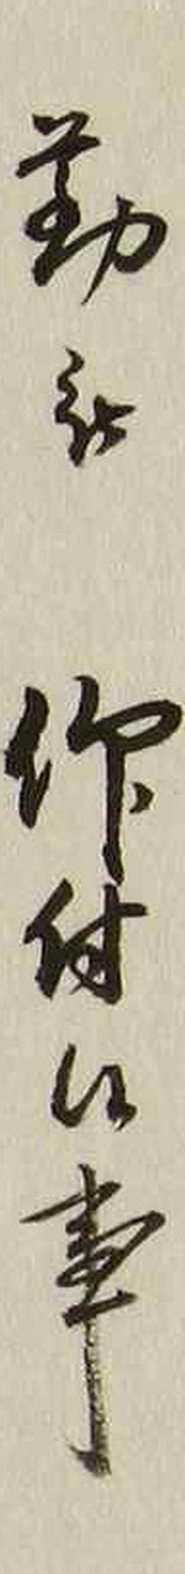勤被仰付候事
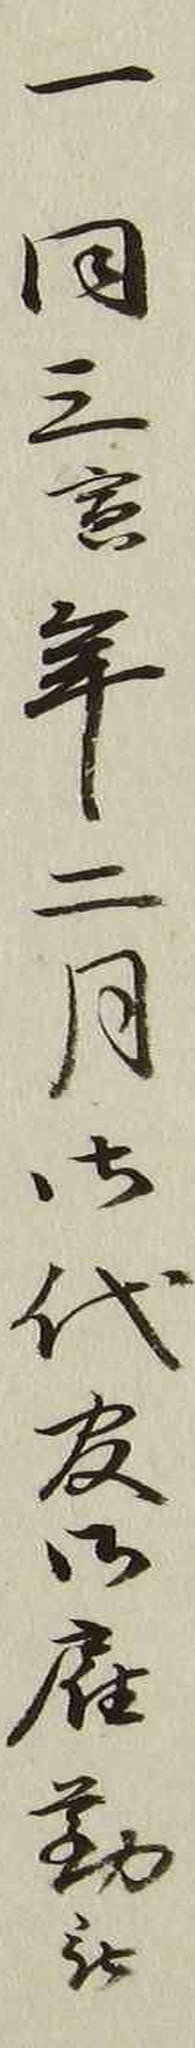一同三寅年二月御代官御雇勤被
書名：諸士系譜　巻之160　な之部2
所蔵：会津若松市立会津図書館
